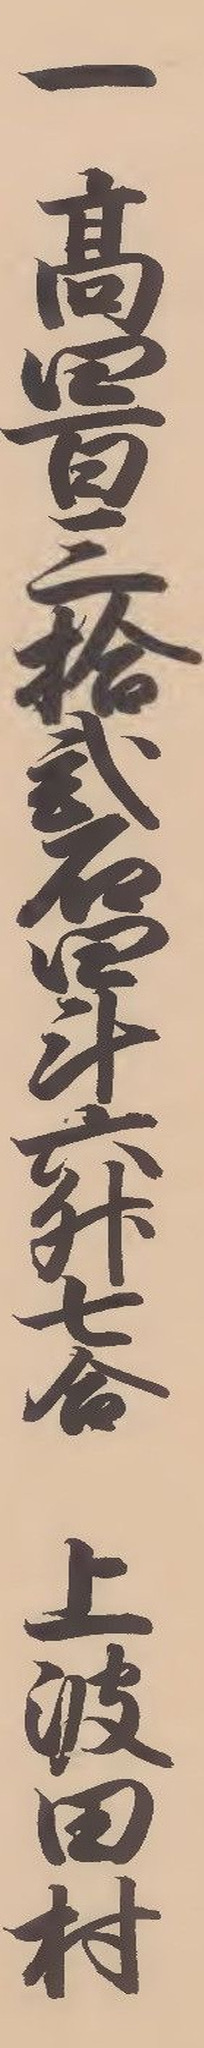一高四百三拾弐石四斗六升七合上波田村
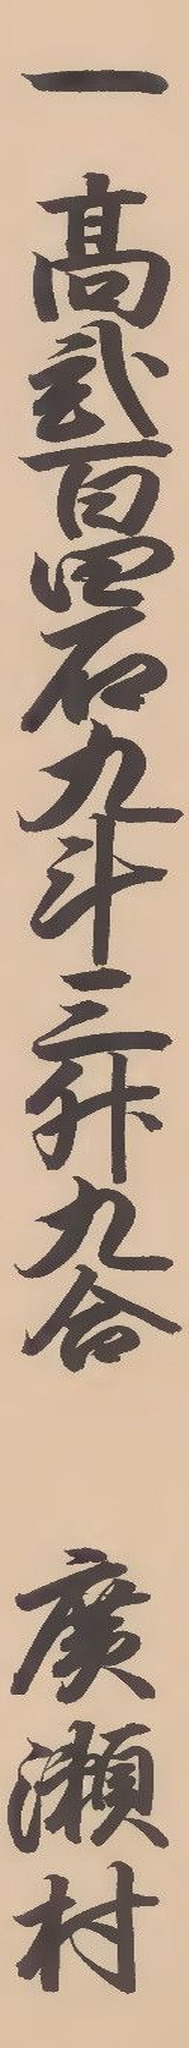一髙弐百四石九斗三升九合廣瀬村
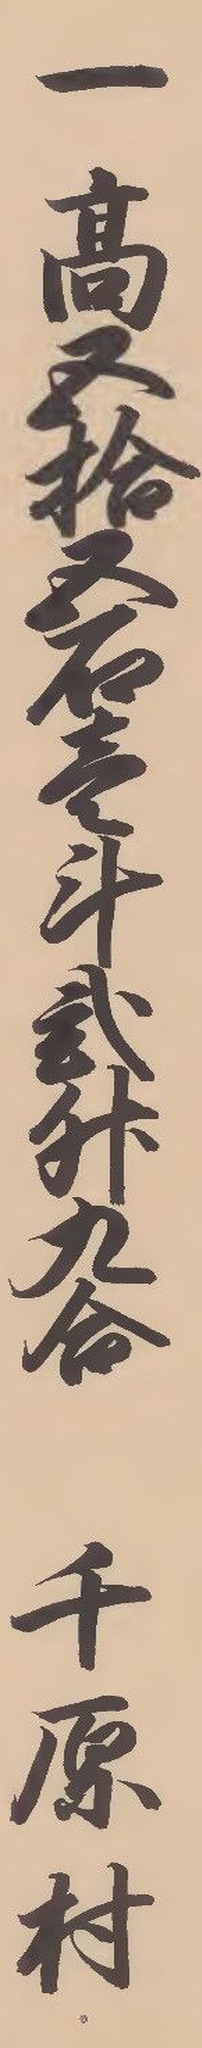一髙五拾五石壱斗弐升九合千原村
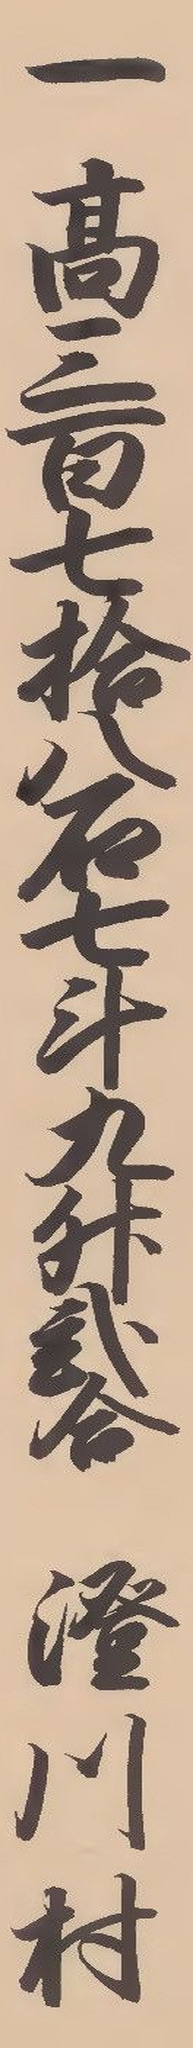一髙三百七拾八石七斗九升弐合澄川村
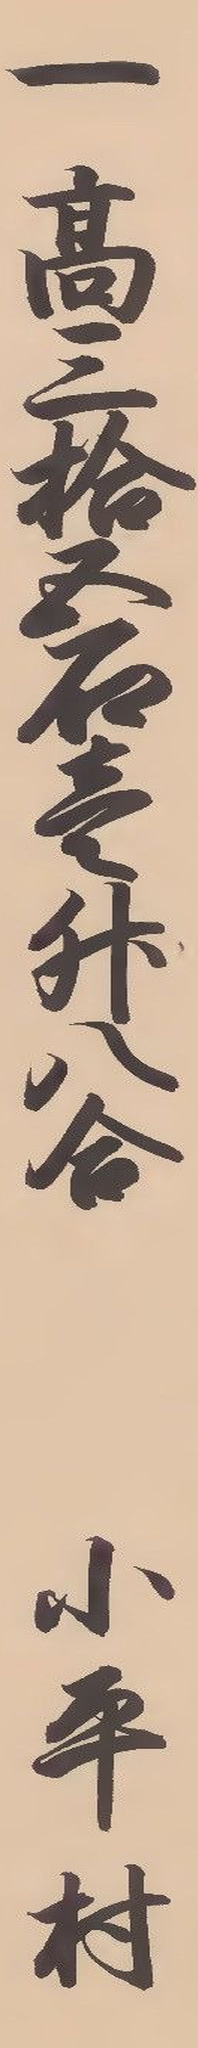一高三拾五石壱升八合小平村
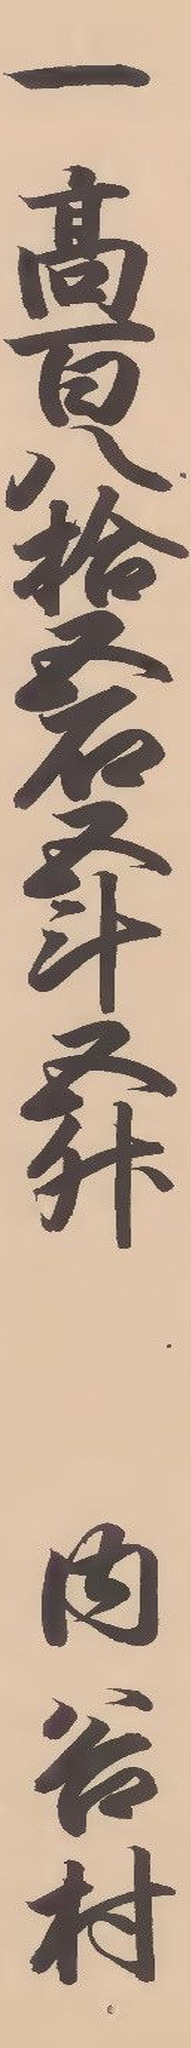一髙百八拾五石五斗五升内谷村
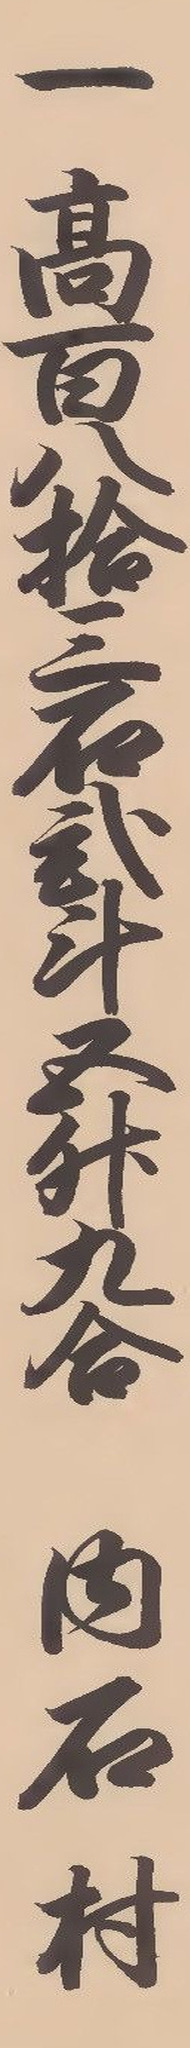一髙百八拾三石弐斗五升九合内石村
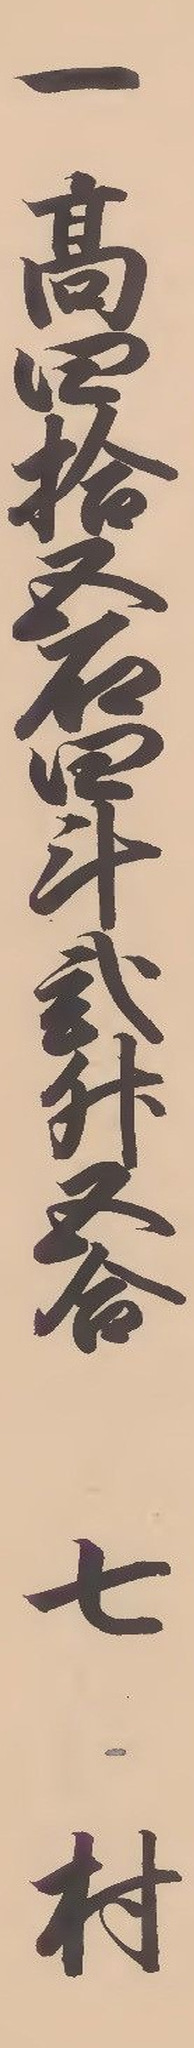一髙四拾五石四斗弐升五合七村

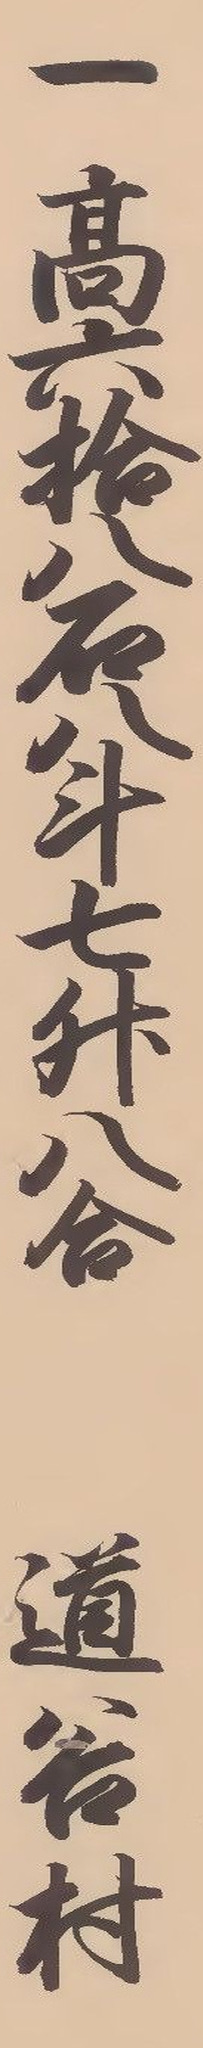一髙六拾八石八斗七升八合道谷村
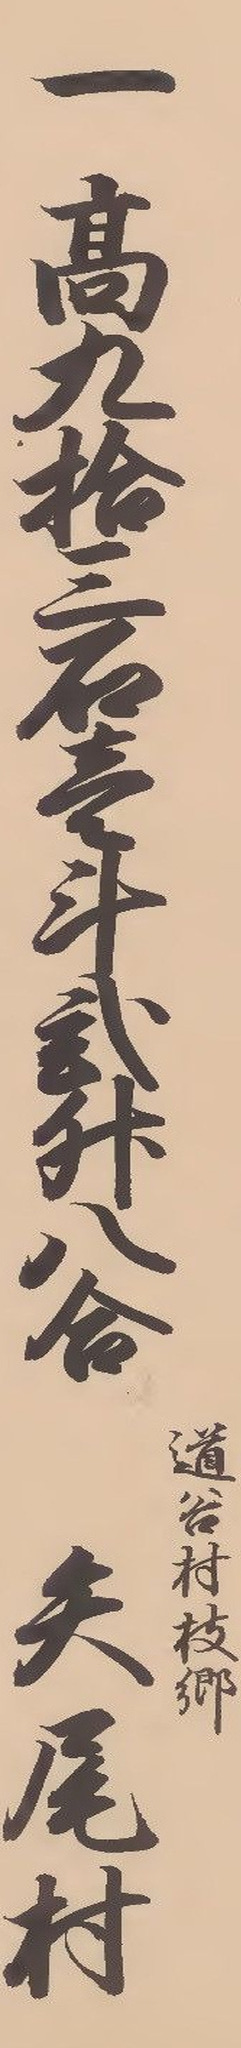一髙九拾三石壱斗弐升八合矢尾村
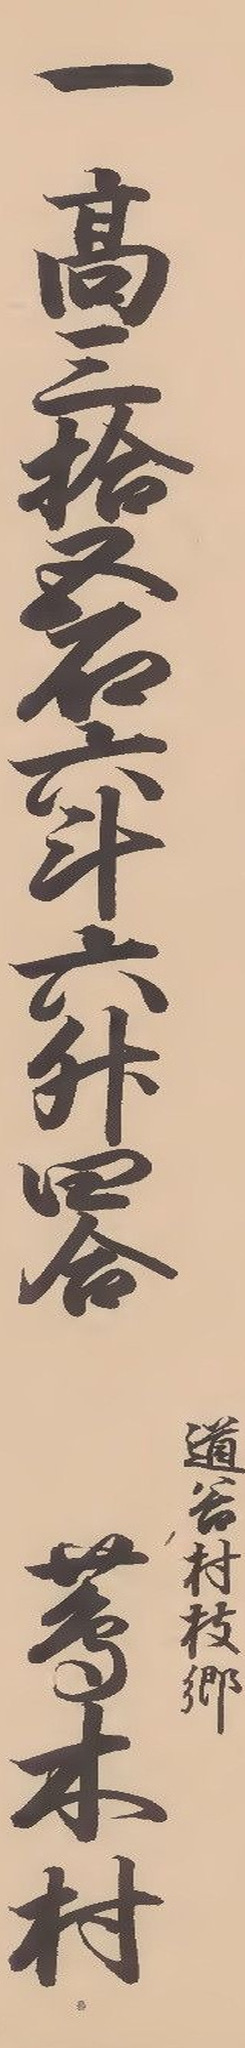一髙三拾五石六斗六升四合蔦木村
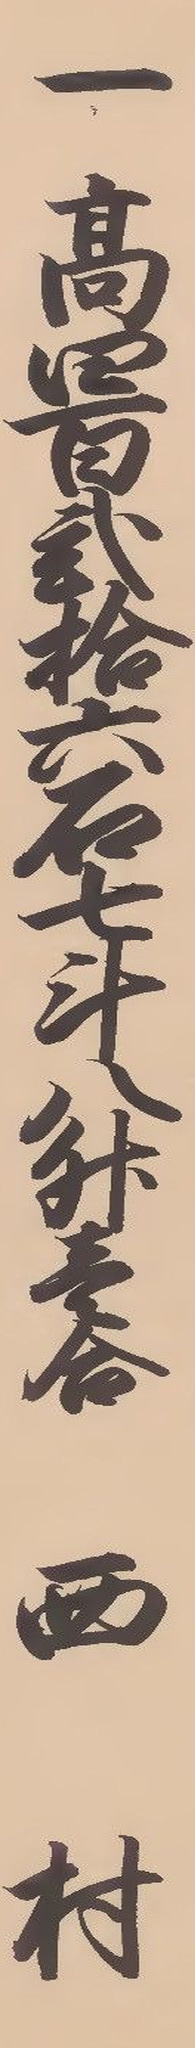一髙四百弐拾六石七斗八升壱合西村
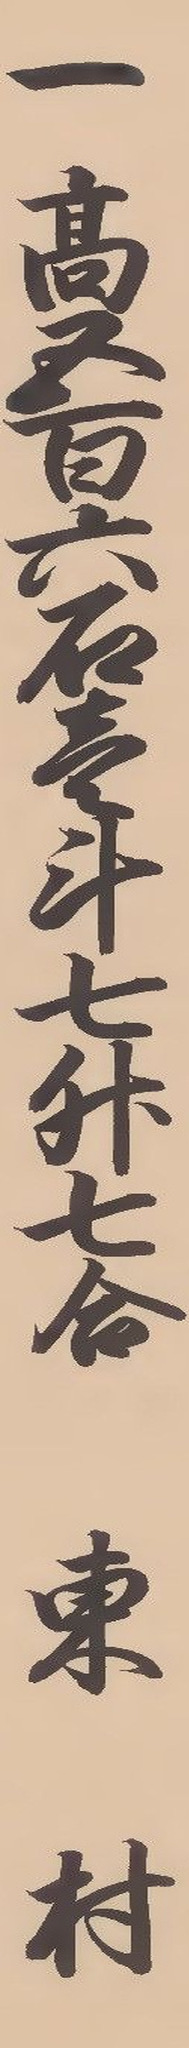一髙五百六石壱斗七升七合東村
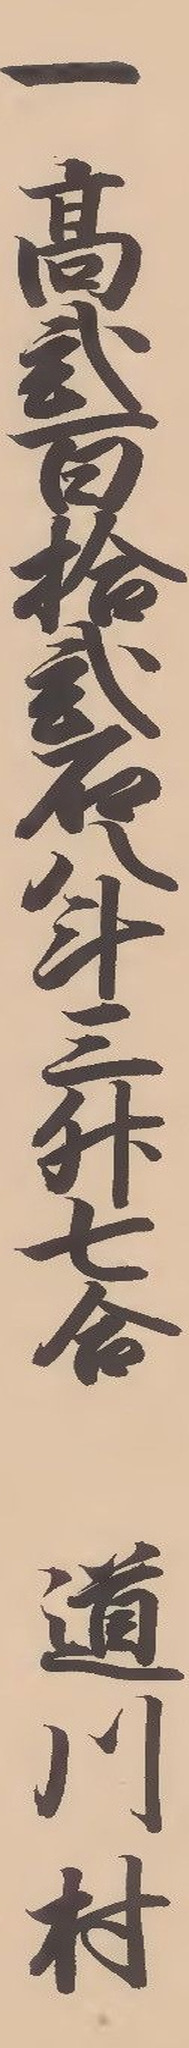一髙弐百拾弐石八斗三升七合道川村
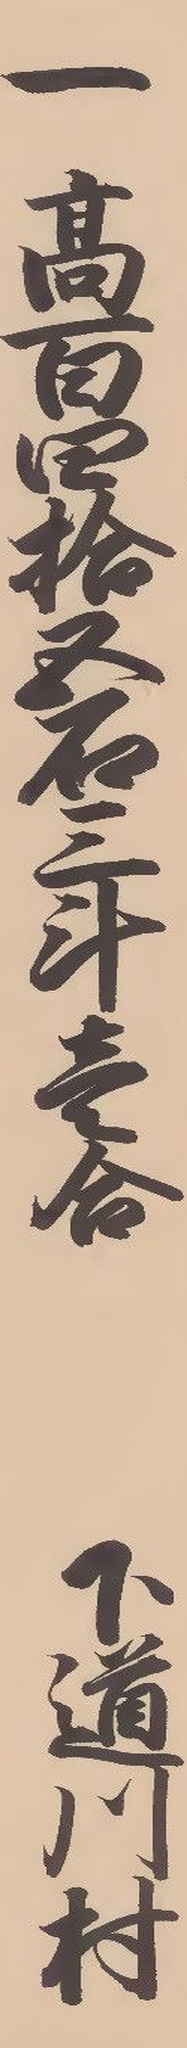一髙百四拾五石三斗壱合下道川村
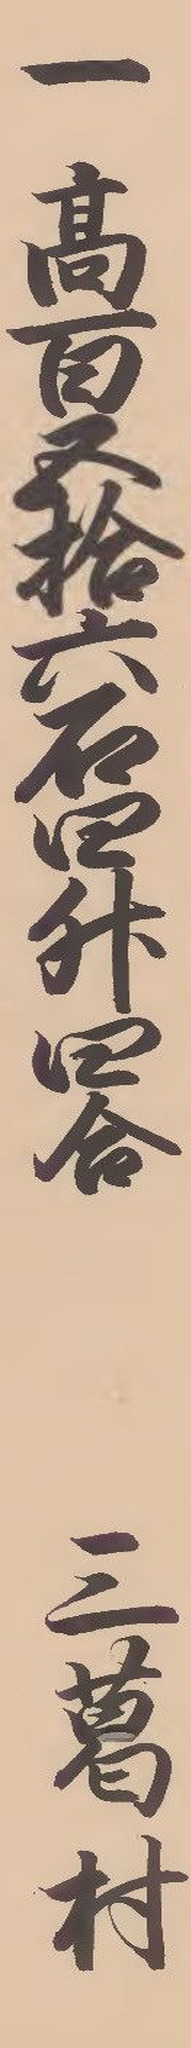一髙百五拾六石四升四合三葛村
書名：石見国郷帳
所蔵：国立公文書館 National Archives of Japan
